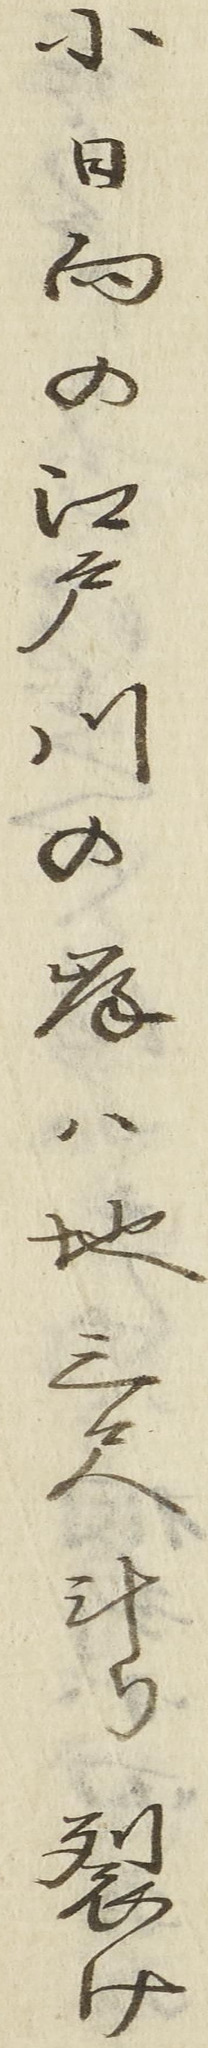小日向の江戸川の岸は地三尺計り裂け

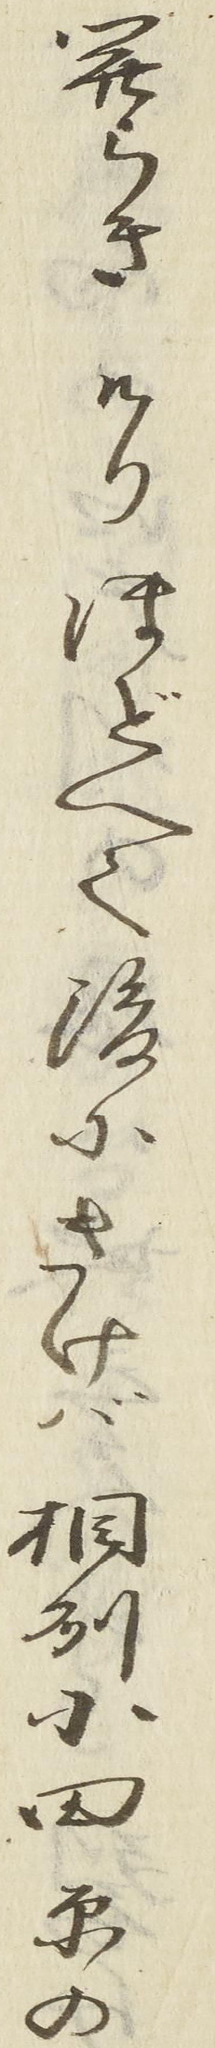開らきけりほどへて後にきけば相州小田原の
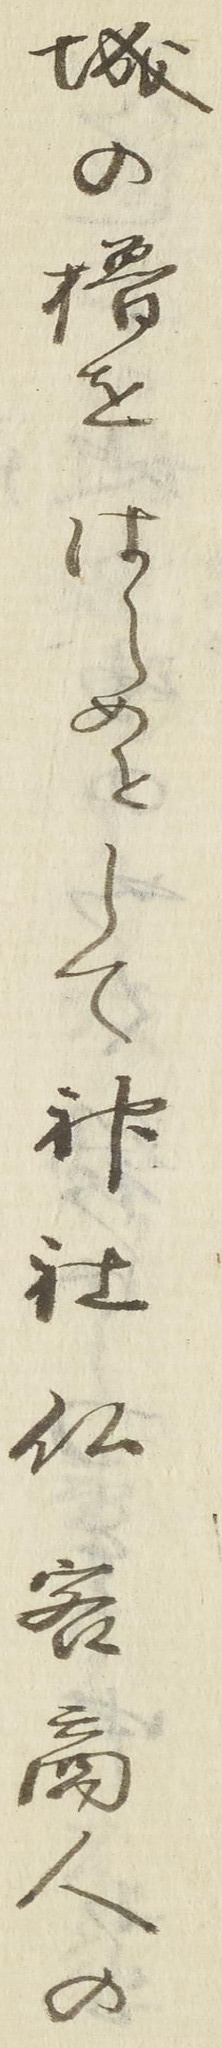城の櫓をはしめとして神社仏客商人の
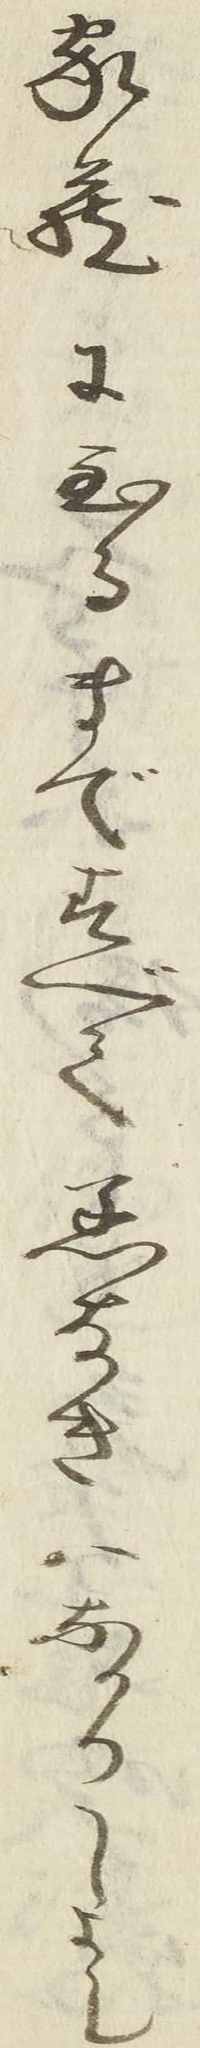家蔵に至るまですべて恙なきはなかりしよし
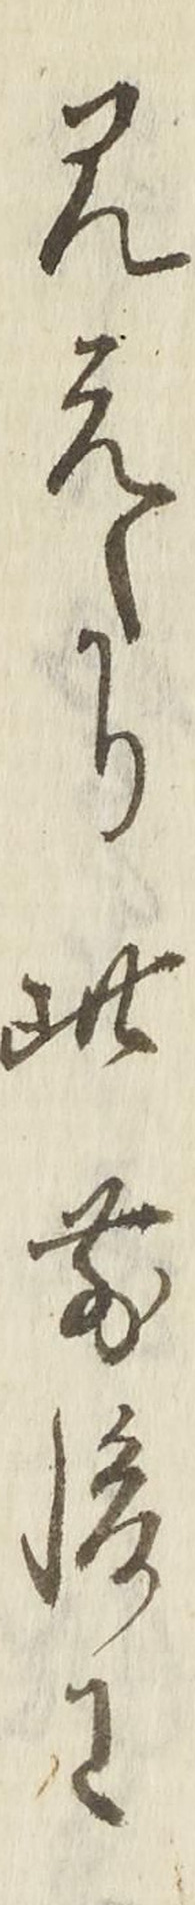見えたり此前後に
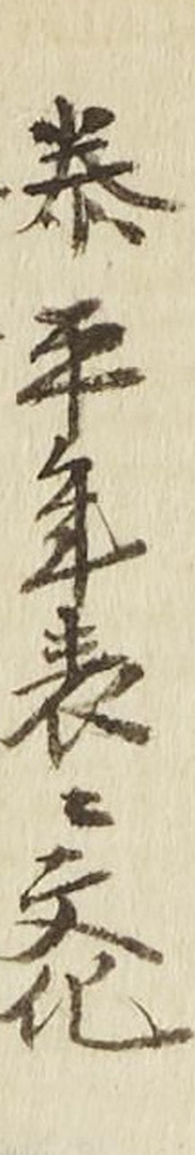泰平年表に文化
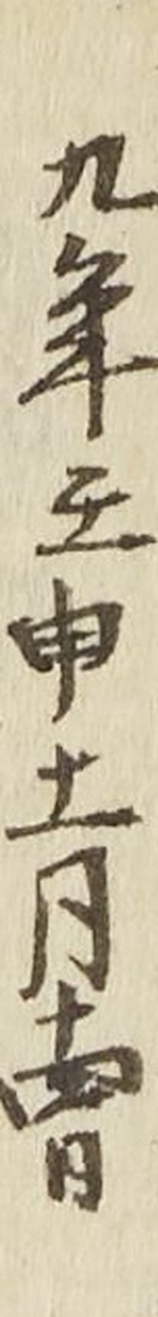九年壬申十一月十四日
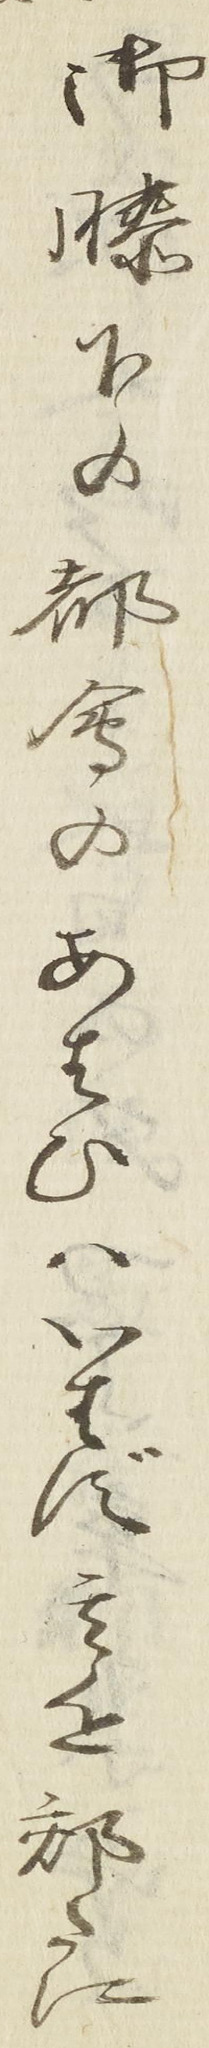御膝下の都会のあはひはいはず其近郊たに
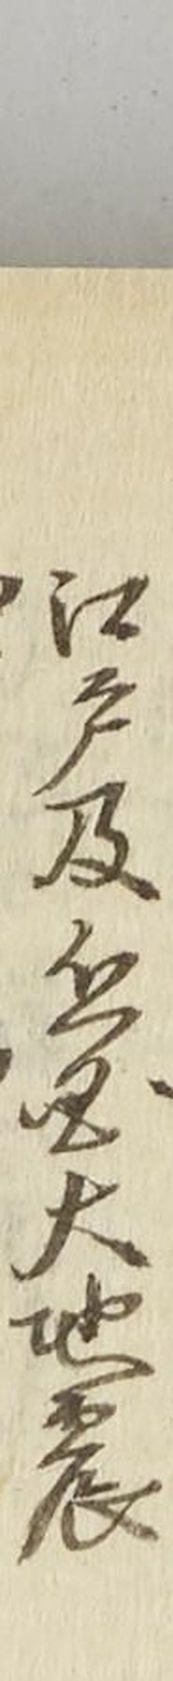江戸及近国大地震
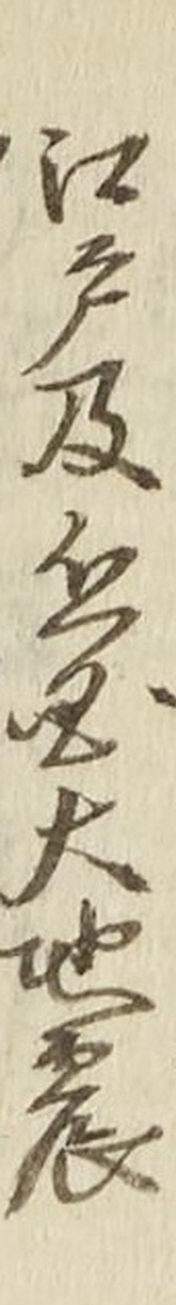江戸及近国大地震
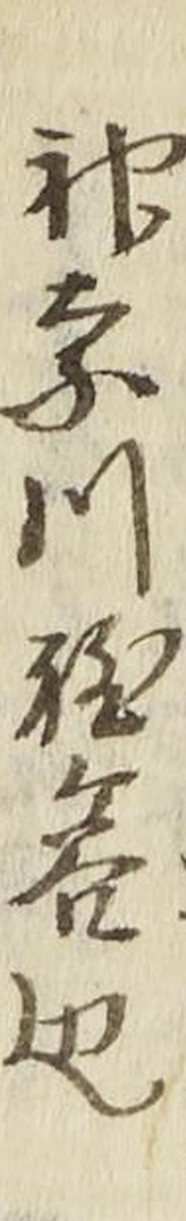神奈川程ケ谷辺
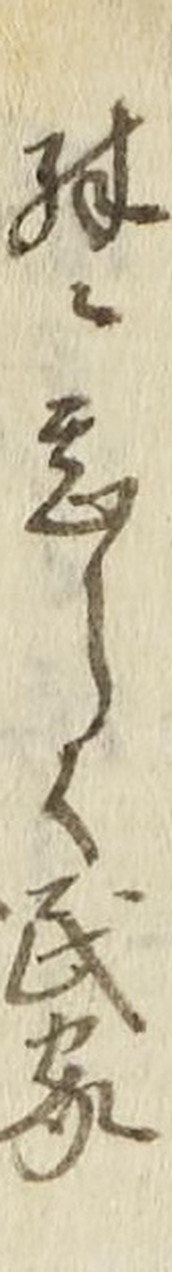殊に甚しく民家
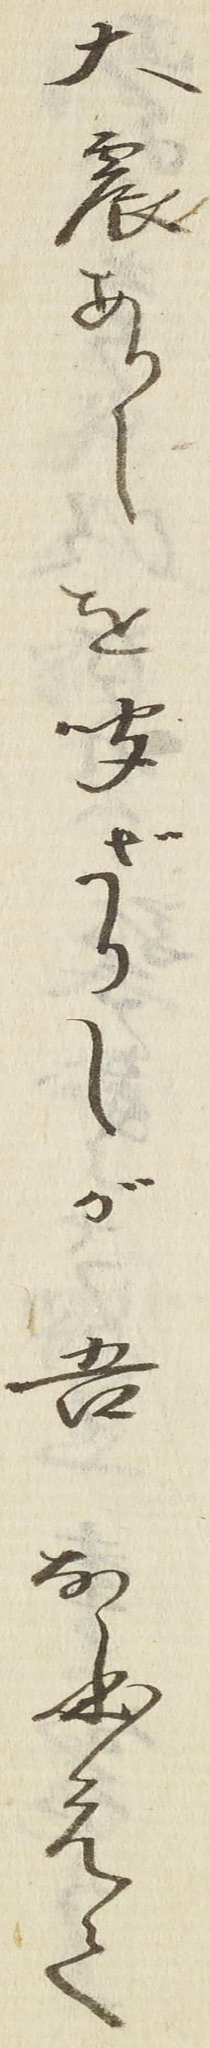大震ありしを聞ざりしが吾おほえて
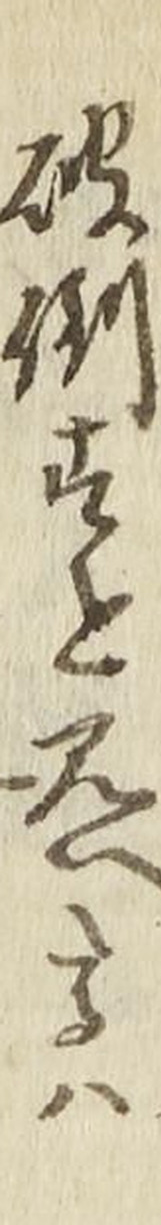破倒すと見へたるは
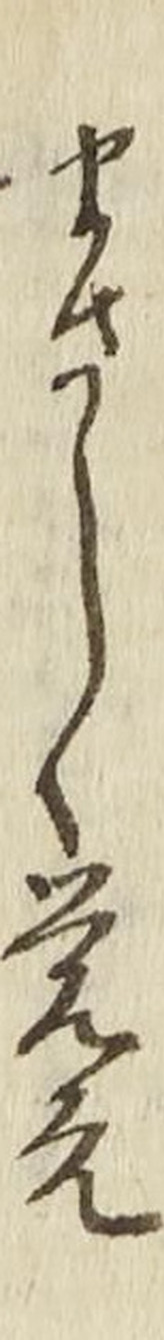まさしく覚え
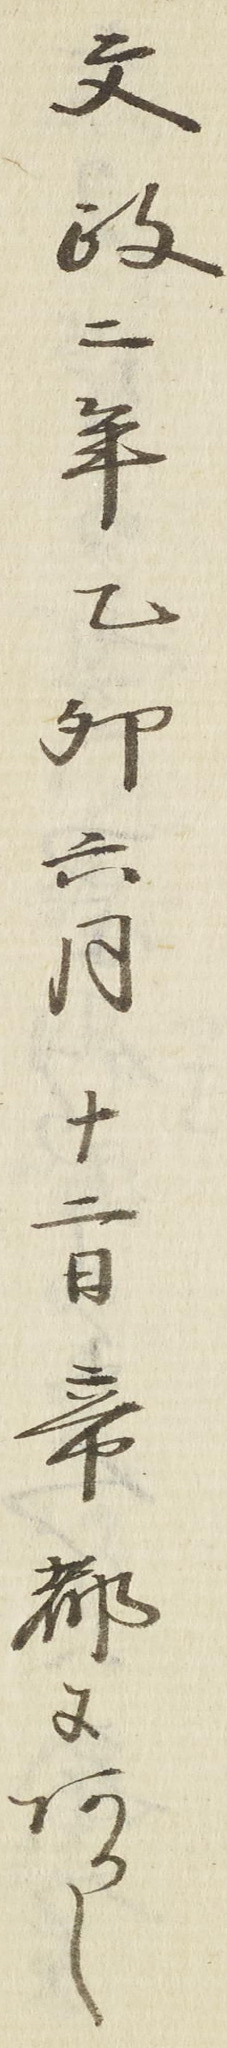文政二年乙夘六月十二日帝都にありし
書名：やぶれ窓の記　全
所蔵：東京大学地震研究所図書室 Earthquake Research Institute Library, The University of Tokyo, JAPAN
